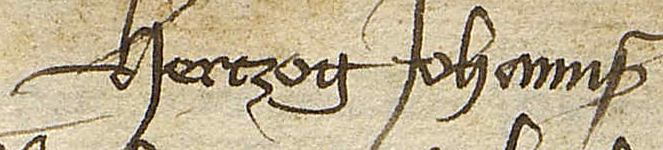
Hercʒog Iohannſ*
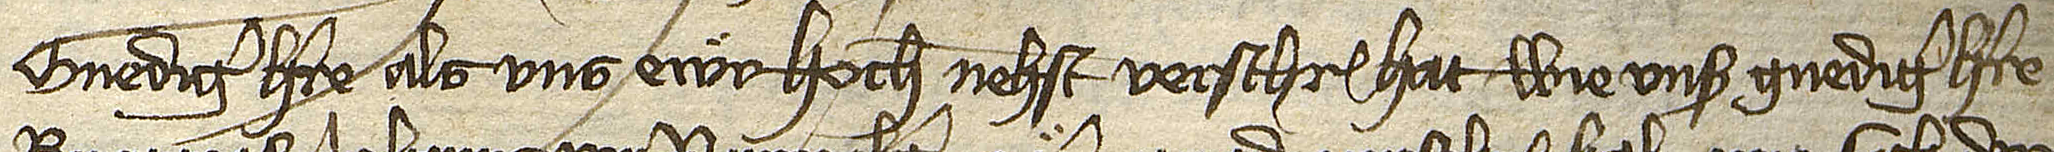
Gnedig* h*re als vns eẅr hoch* nehſt verſchr* hat / wie vnſ* gnedig* h*re
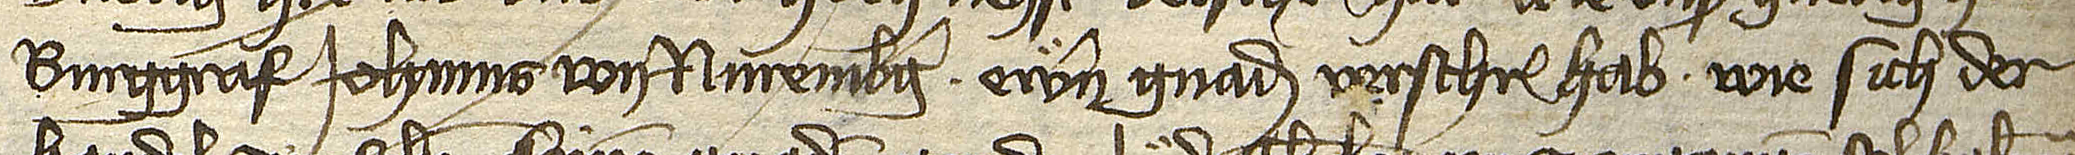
Burggraf Iohanns von Nuremb*g . eẅ*n gnad* verſchr* hab . wie ſich der
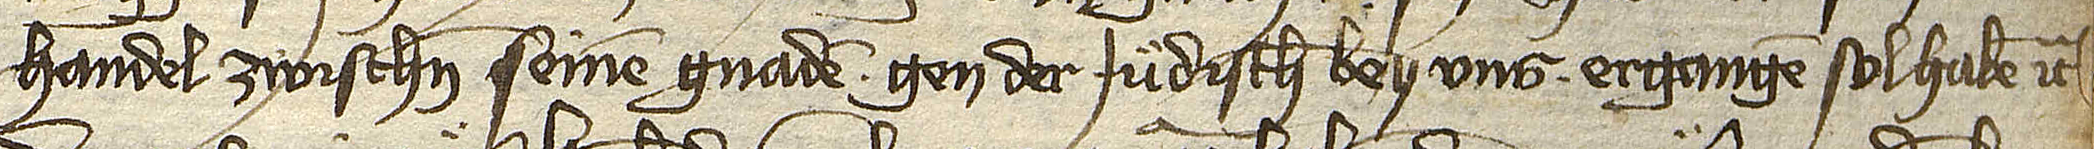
handel ʒwiſchn* ſeine* gnade* . gen der Iüdiſch* bey vns . ergange* ſol habe* ec*
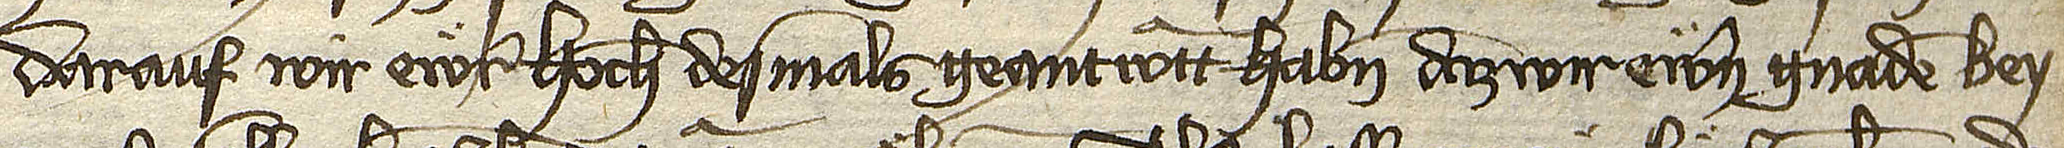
Darauf wir eẅr* hoch* deſmals geantw*tt habn* daʒ wir eẅ*n gnade* bey
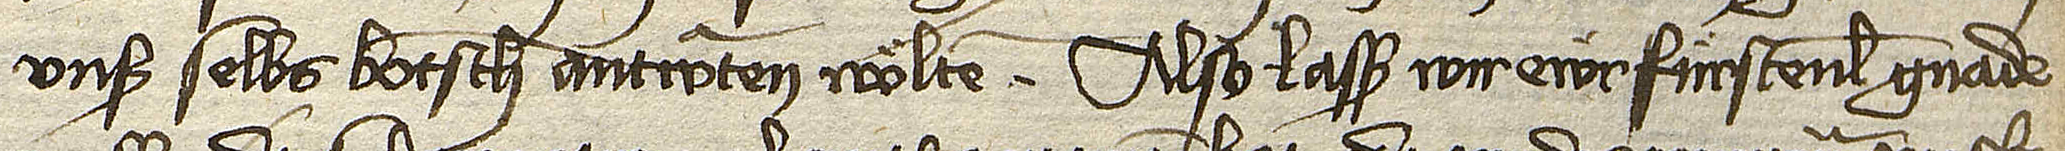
vnſ* ſelbs botſch* antw*ten wölte* . Alſo laſſ* wir eẅr fürſtenl* gnade
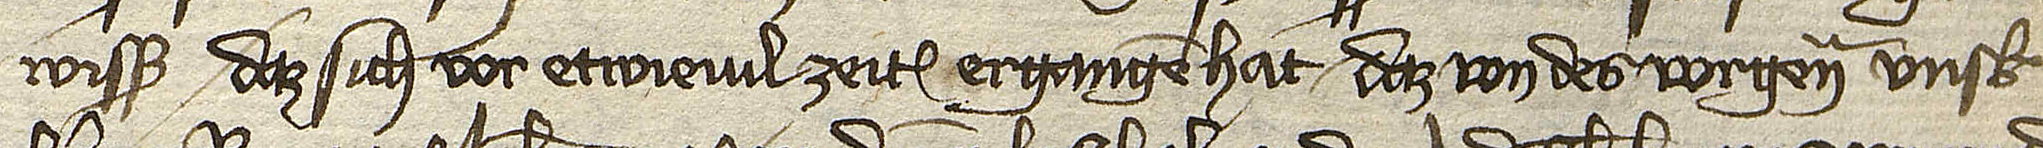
wiſſ* / daʒ ſich vor etwieuil ʒeit* ergange* hat / daʒ von des vorgen* vnſ*s
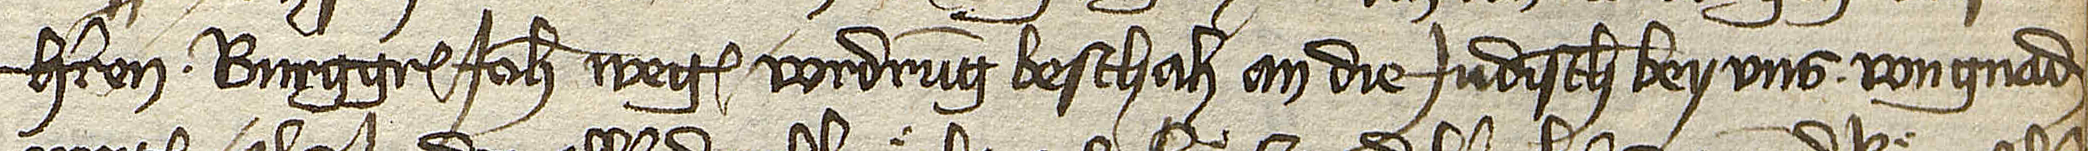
h*ren . Burggr* Ioh* weg* vordru*g beſchah an die Iudiſch* bey vns . von gnad*
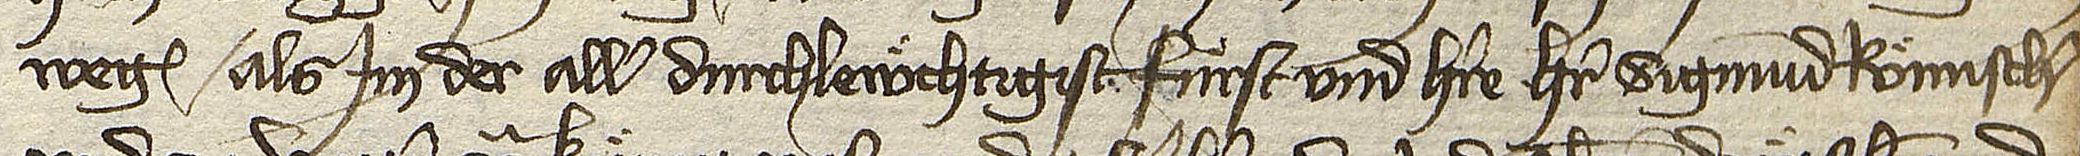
weg* / als Im der all* durchleẅchtigiſt fürſt vnd h*re hr* Sigmu*d Römiſch*
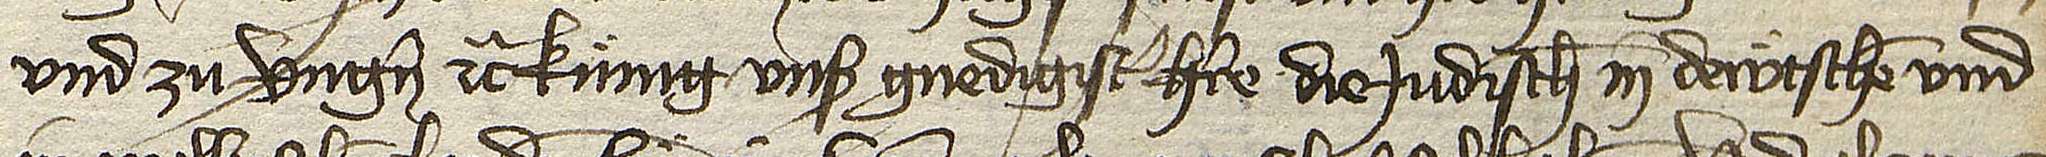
vnd ʒu Vng*n ec* künig vnſ* gnedigiſt* h*re . die Iudiſch* in deẅtſche* vnd
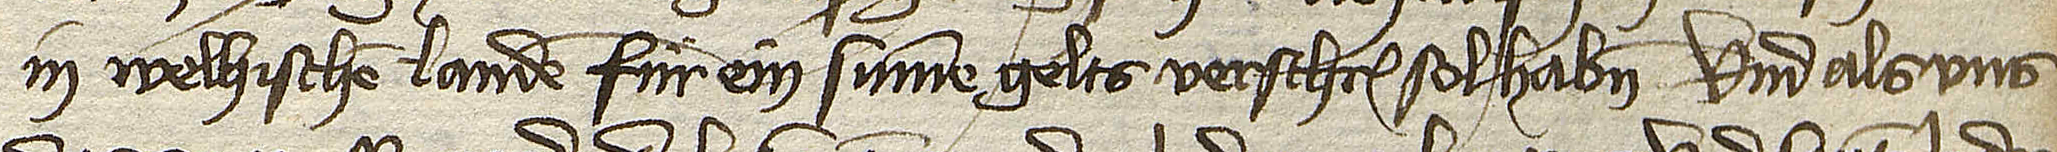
in welhiſche* lande* für ein ſum*e gelts verſchr* ſol habn* Vnd als vns
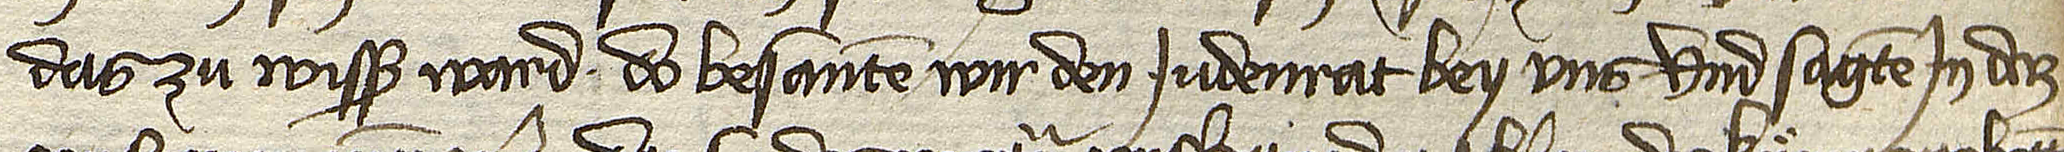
das ʒu wiſſ* ward . Do beſante* wir den Iudenrat bey vns Vnd ſagte* In daʒ
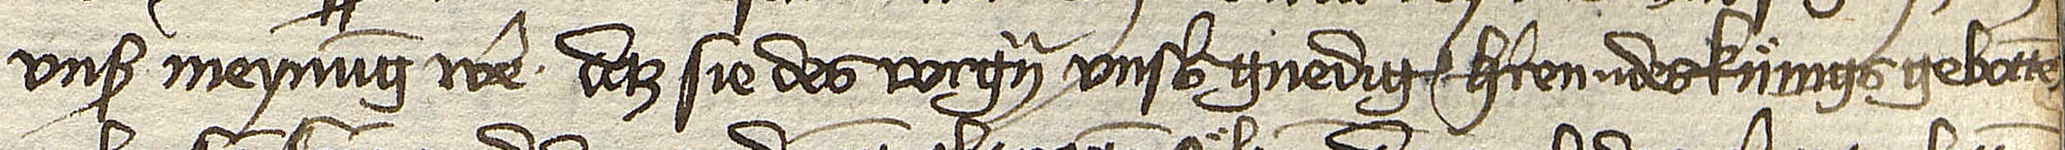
vnſ* meynu*g w*e . daʒ ſie des vorgn* vnſ*s gnedig* h*ren ~ des künigs gebotte*
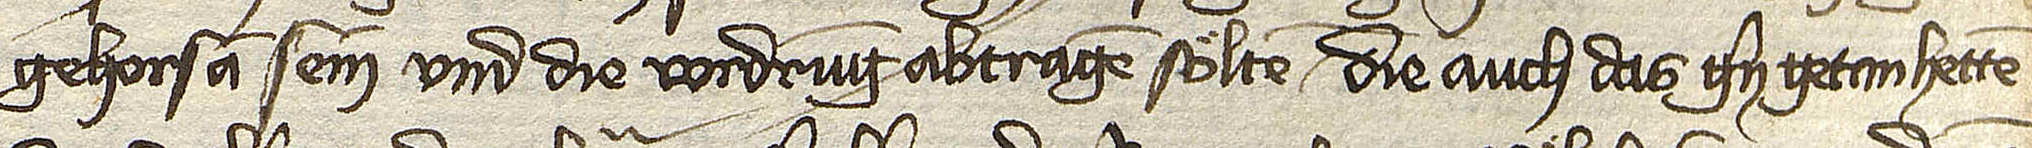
gehorſa* ſein vns die vordru*g abtrage* ſölte* / die auch das g*n getan hette*
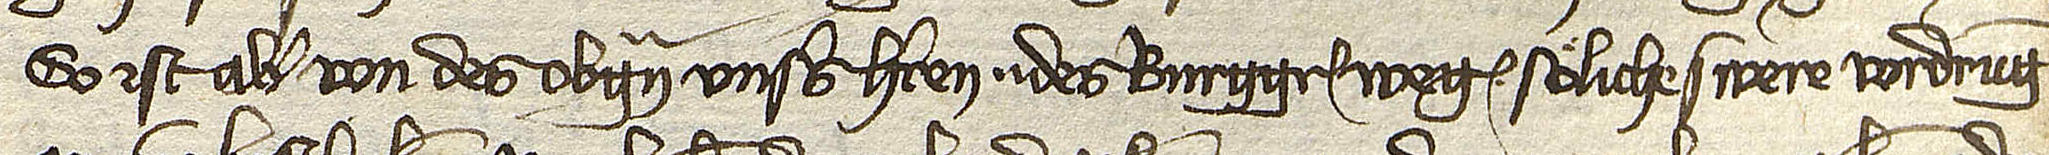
So iſt ab* von des obgn* vnſ*s h*ren ~ des Burggr* weg* ſöliche ſwere vordru*g
